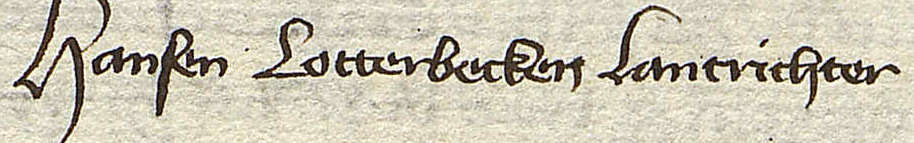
Hanſen Lotterbecken Lantrichter
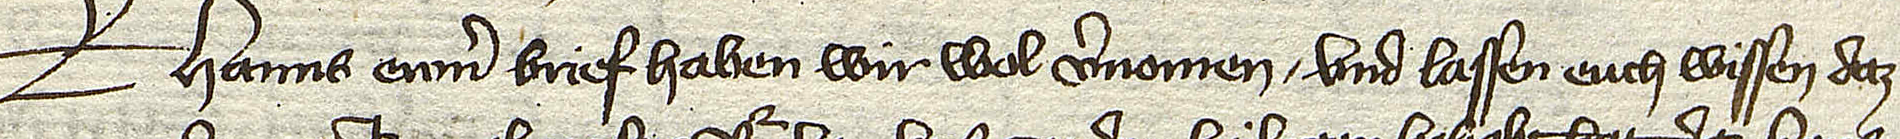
L* Hanns ewn* brief haben wir wol v*nomen / vnd laſſen euch wiſſen daʒ
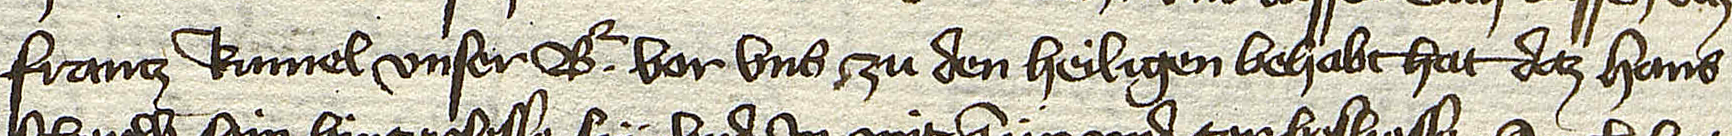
francʒ Rumel vnſer B* . vor vns ʒu den heiligen behabt hat daʒ Hans
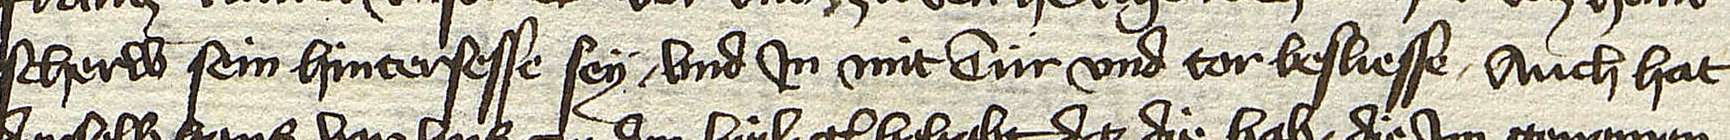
ſcherw ſein hinterſeſſe ſey / vnd In mit Tür vnd tor beſlieſſe / Auch hat
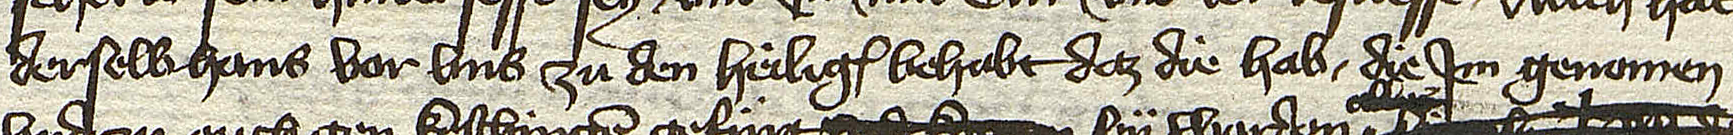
derſelb* hans vor vns cʒu den heilig* behabt daʒ die hab / die Im genomen
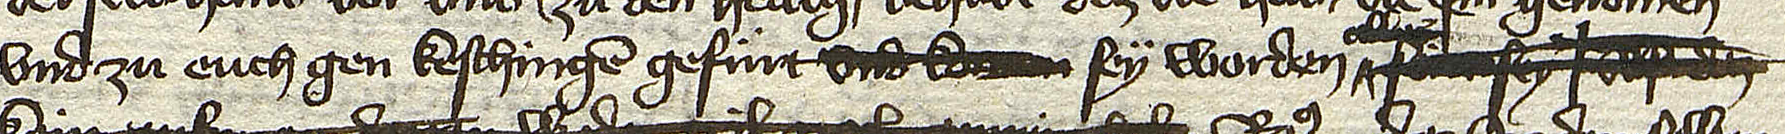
vnd ʒu euch gen keſchinge* gefürt vns komen ſey worden ſein ſey Alſo daʒ
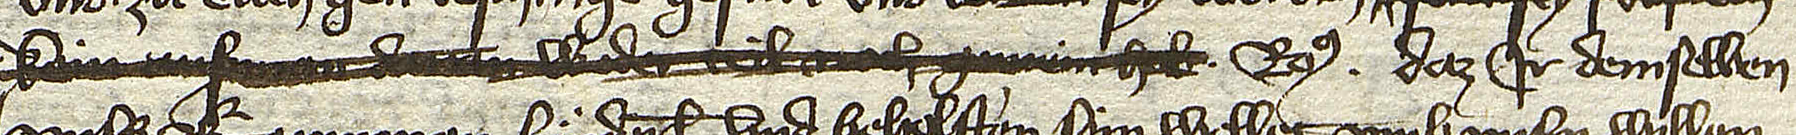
kein auſ*man daran weder teil noch gemein hab . Ro* daʒ Ir demſelben
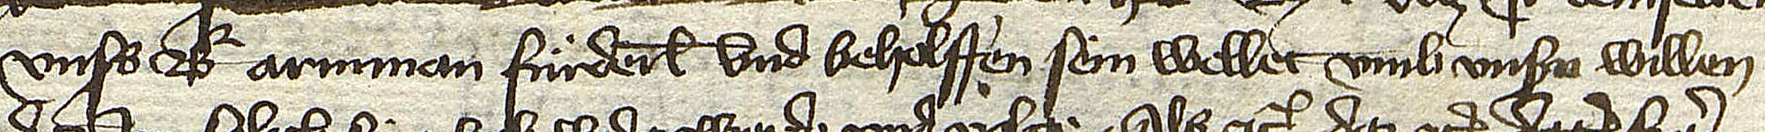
vnſ*s B* armman fürderl* vnd beholffen ſein wellet vmb vnſ*n willen
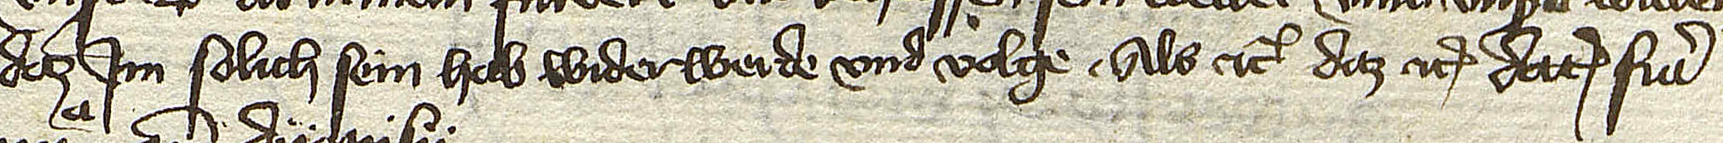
daʒ Im ſolich ſein hab wider werde vnd volge . Als ec* daʒ ec* dat* fia
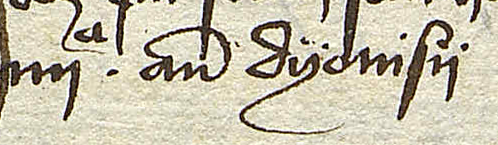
iiii* . an* dyoniſii
